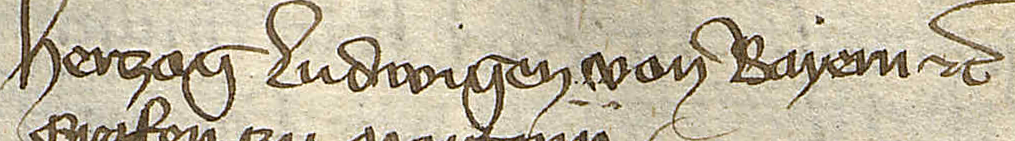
Hercʒog Ludwigen von Bayern ec*
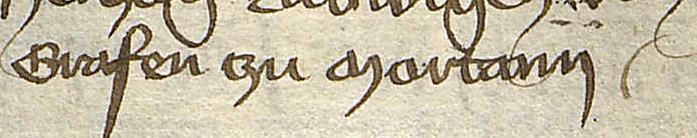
Grafen cʒu Mortanii /
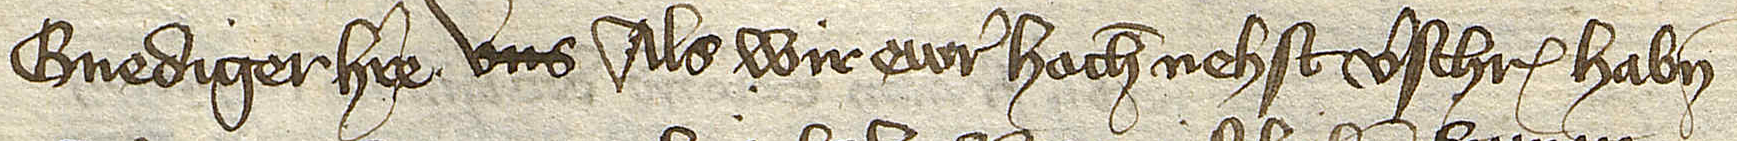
Gnediger g*re Vns Als wir ewr* hoch* nehſt v*ſchr* habn*
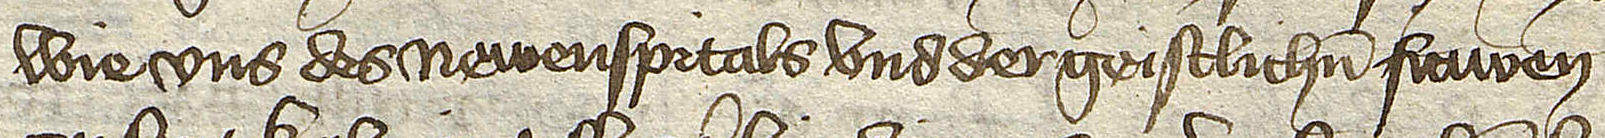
wie vns des Newenſpitals vnd der geiſtlichn* frawen
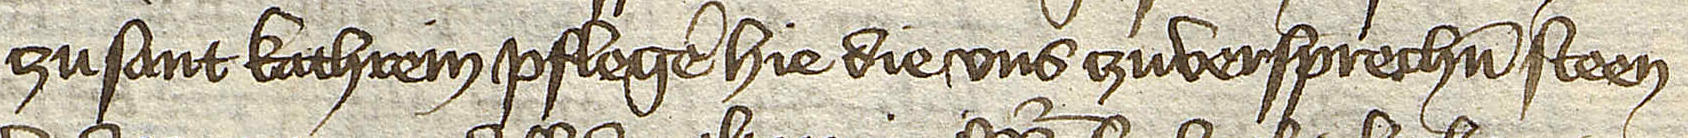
cʒu ſant kathrein pflege* hie die vns cʒuverſprechn* ſteen
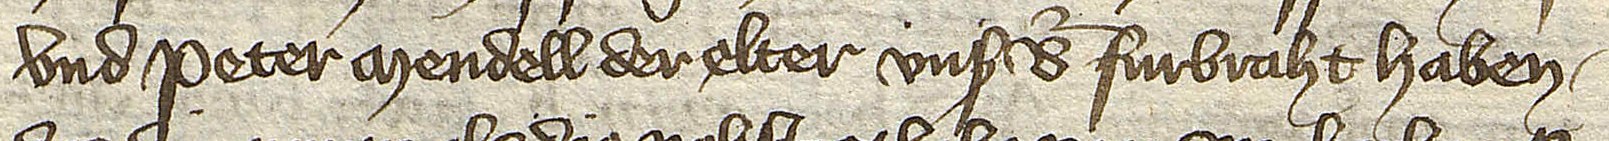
vnd peter Mendell der elter vnſ* B* furbraht haben /
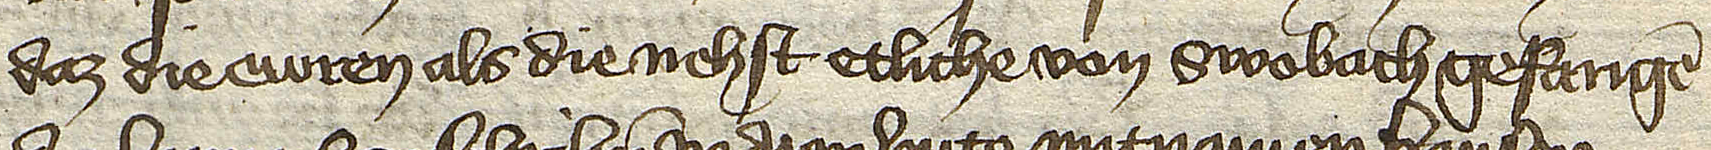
daʒ die ewren als die nehſt etliche von Swobach gefange*
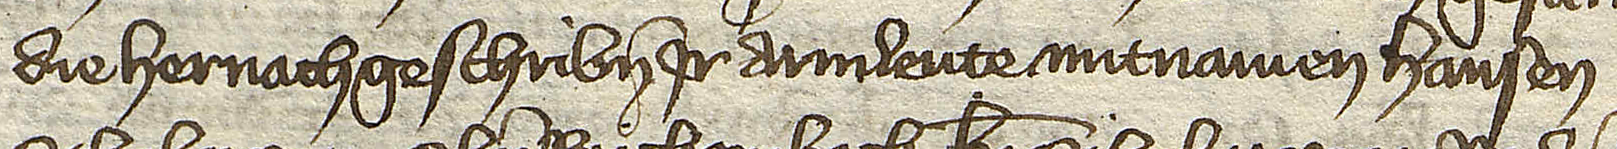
die hernach geſchribn* Ir Armleute mitnamen hanſen
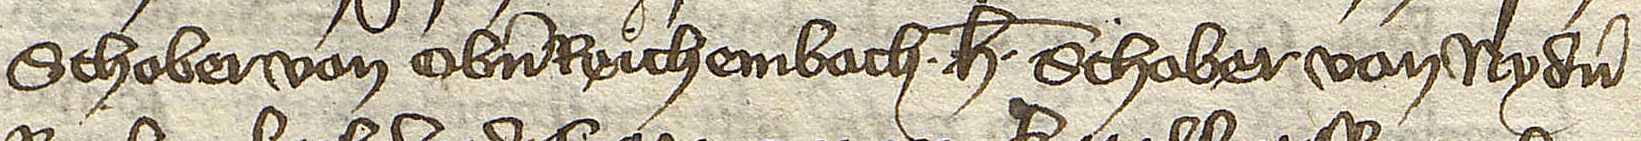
Schober von Obn* Reichembach . h* . Schober von Nydn*
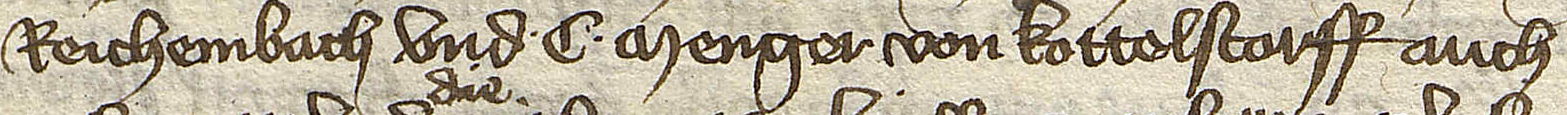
Reichembach vnd . C . Menger von kottelſtorff auch
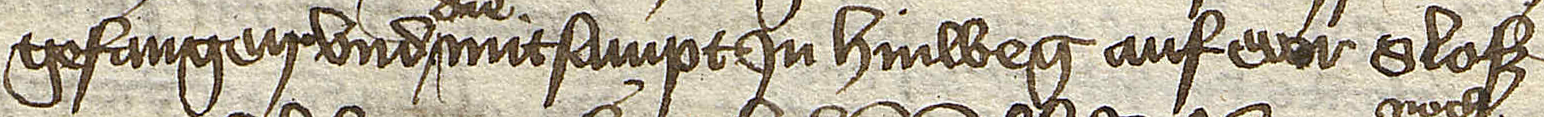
gefangen vnd mitſampt In hinweg auf ewr Sloſʒ
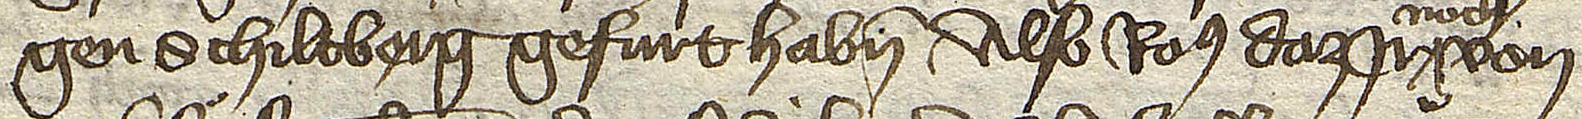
gen Schiltberg gefürt habn* / Alſo Ro* daʒ Ir von
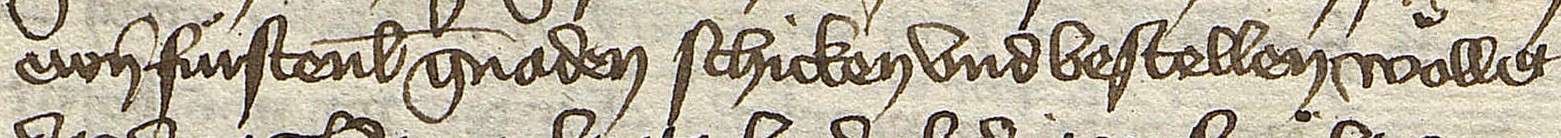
ew*n fürſtenl* gnaden ſchicken vnd beſtellen wöllet
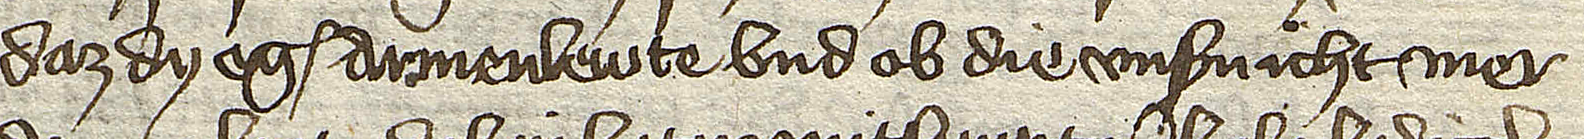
daʒ dy eg* Armenlewte vnd ob die vnſ*n icht mer
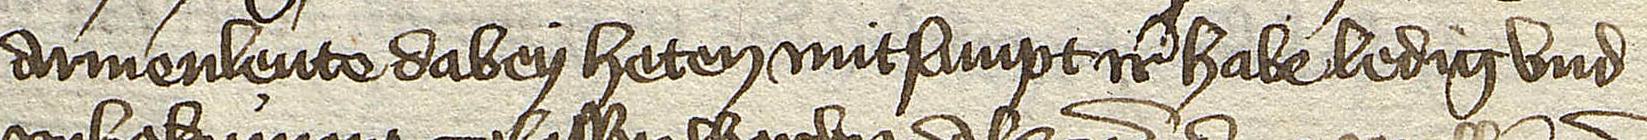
Armenleute dabey heten mitſampt ir* habe ledig vnd
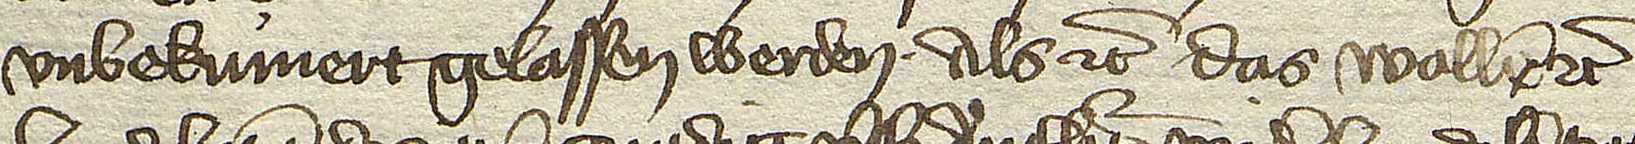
vnbekümert gelaſſen werden . Als ec* / das wolle* ec*
